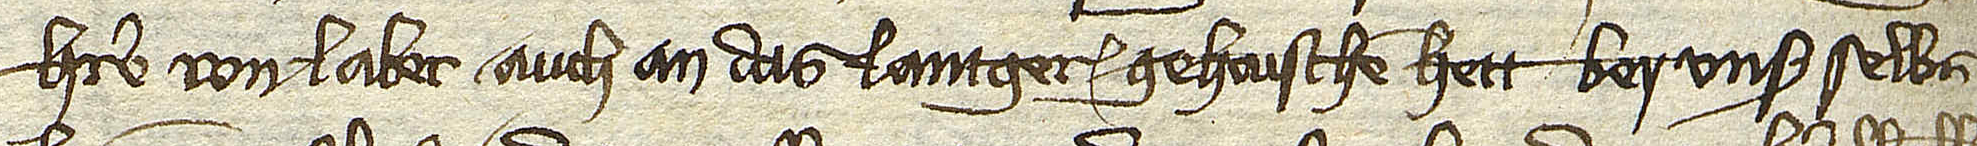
h*re von laber / auch an das lantger* gehaiſche* hett bey vnſ* ſelbs
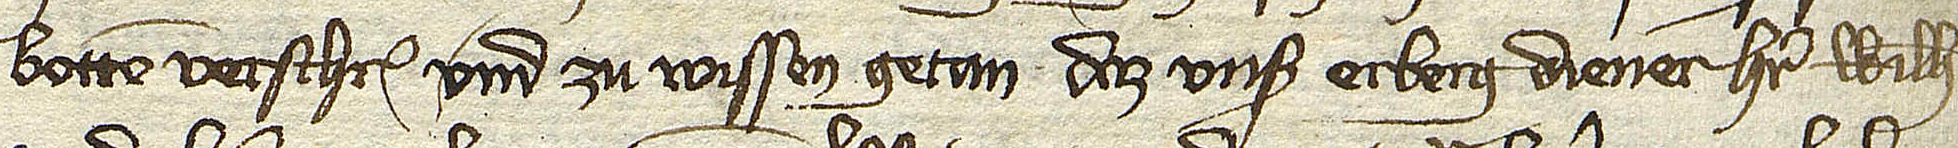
botte* verſchr* / vnd ʒu wiſſen getan . daʒ vnſ* erberg diener h*r Wilh*
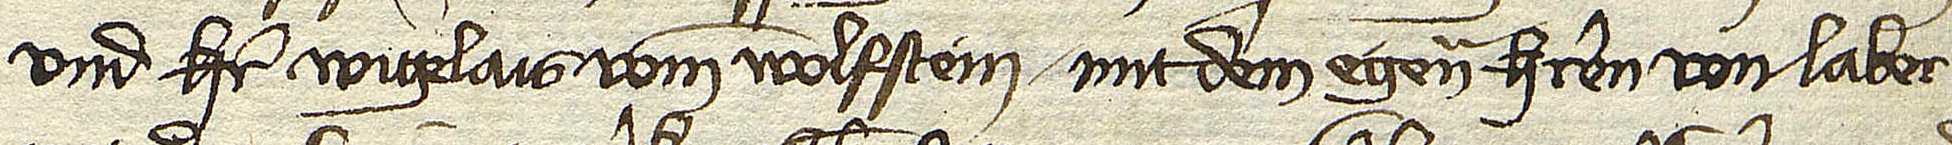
vnd h*r wigelais vom* wolfſtein / mit dem egen* h*ren von laber
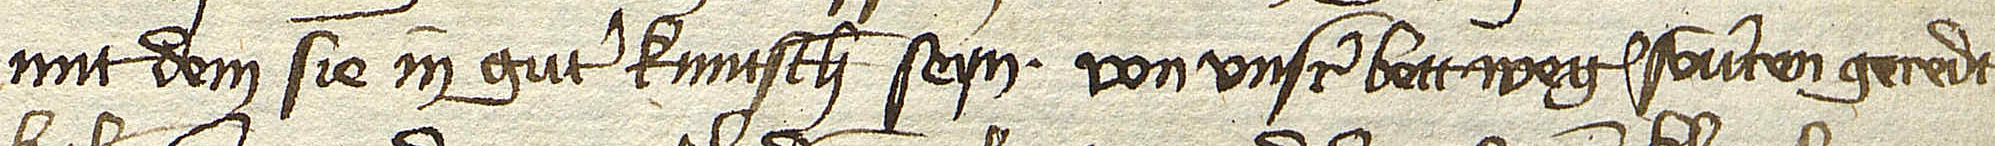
mit dem ſie in gut* kuntſch* ſeyn . von vnſ*r bett weg* ſou*ren geredt
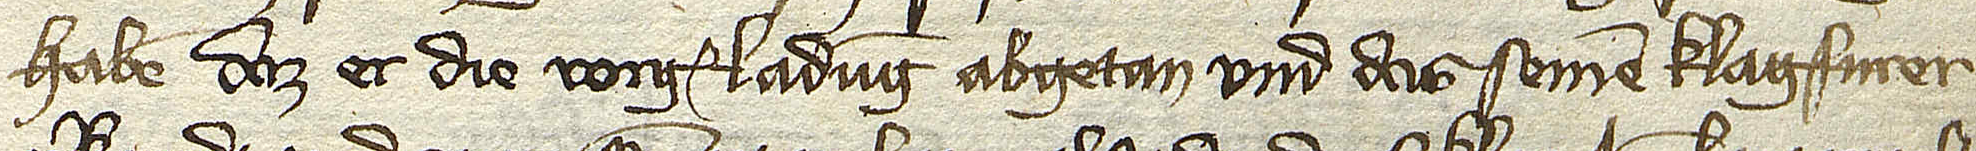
habe* daʒ er die vorg* ladu*g abgetan vnd das ſeine* klagfurer
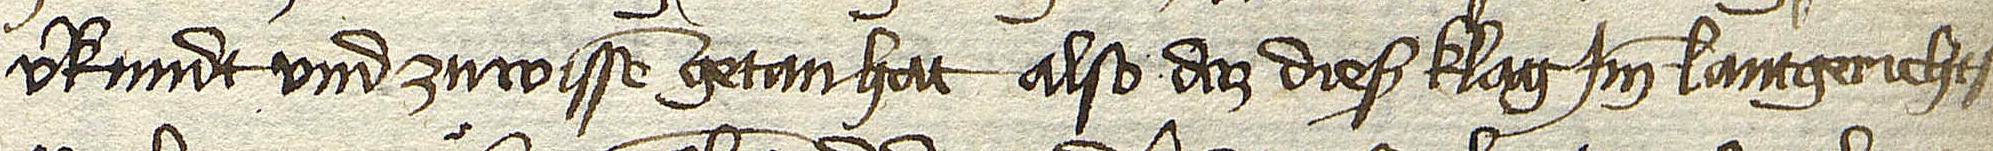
v*kundt vnd ʒu wiſſe* getan hat alſo daʒ dieſ* klag Im* lantgerichtſ
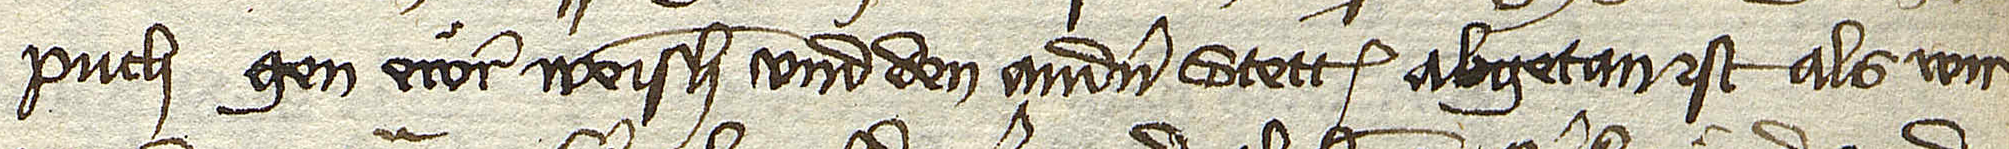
puch gen ew*r weiſh* vnd den and*n Stett* abgetan iſt als wir
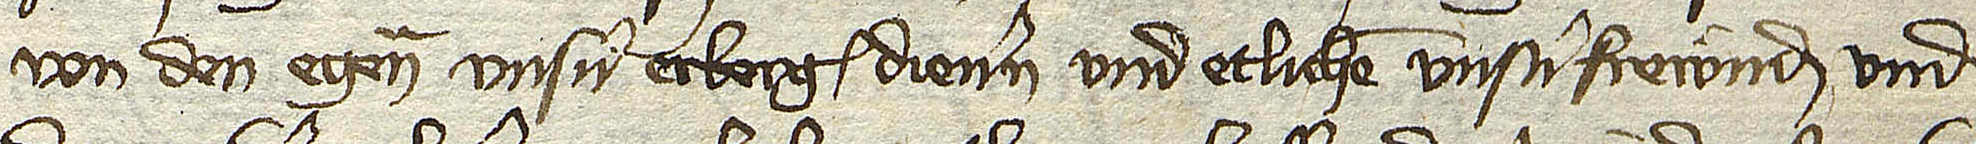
von den egen* vnſ*n erberg* dien*n vnd etliche* vnſ*n frewnd* vnd
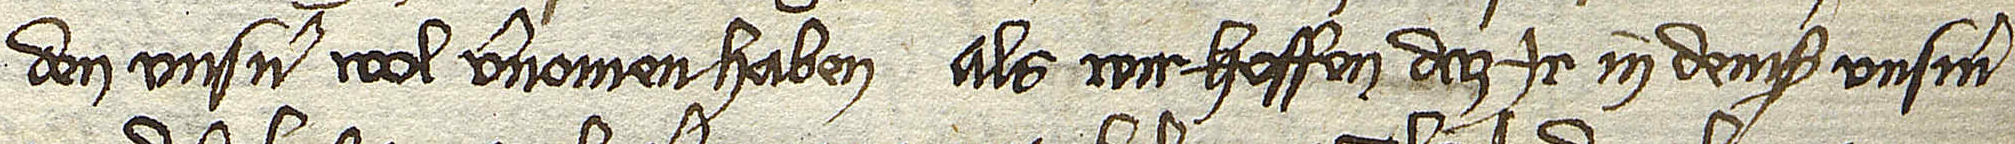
den vnſ*n wol v*nomen haben als wir hoffen daʒ Ir in demſ* vnſ*m
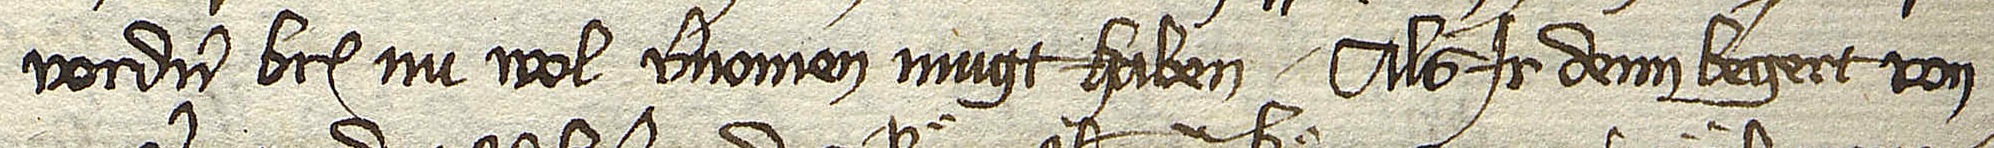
vord*n br* nu wol v*nomen mugt haben / Als Ir denn begert von
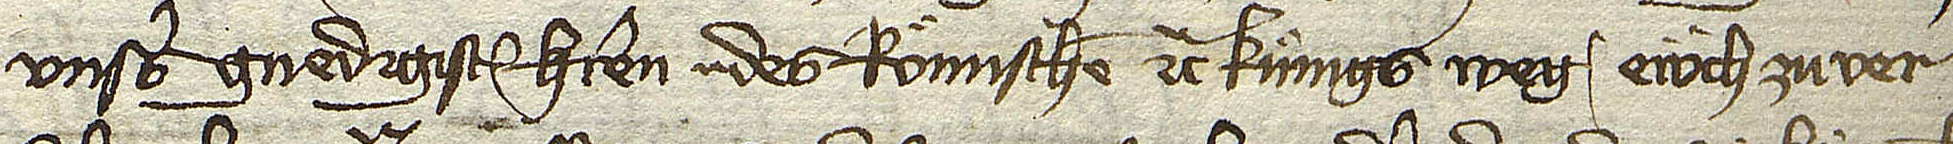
vnſ*s gnedigiſt* h*ren ~ des Römiſche* ec* künigs weg* ewch ʒu ver -
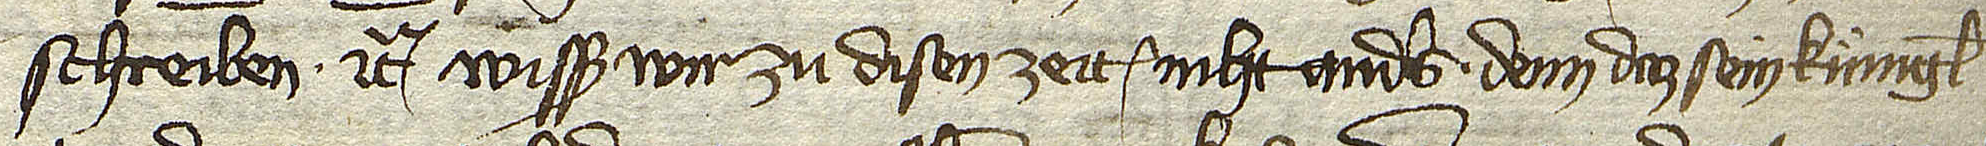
ſchreiben . ec* wiſſ* wir ʒu diſen ʒeit* niht and*s . denn daʒ ſein künigl*
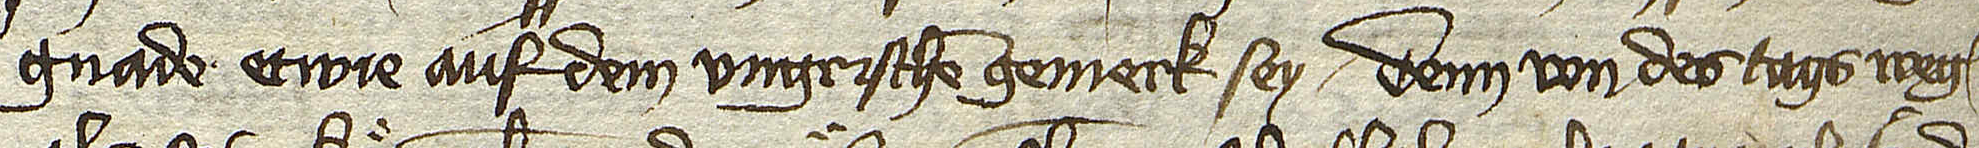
gnade . etwie auf dem vngriſche* gemerk ſey / Denn von des tags weg*
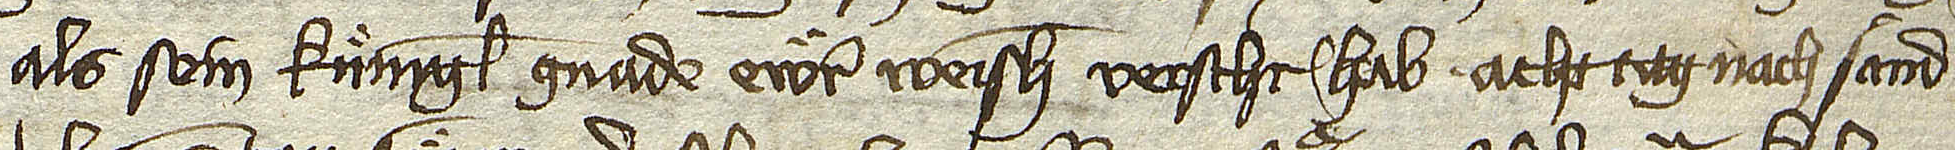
als ſein künigl* gnade ew*r weiſh* verſchr* hab . acht tag nach ſand
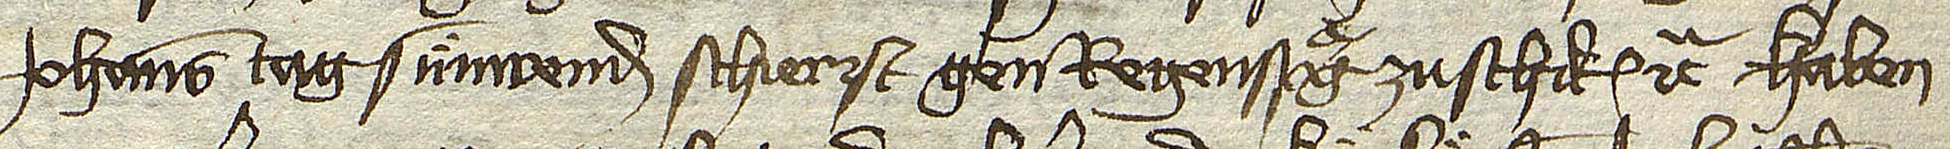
Iohans* tag ſünwend* ſchieriſt gen Regenſp*g ʒuſchik* ec* haben
